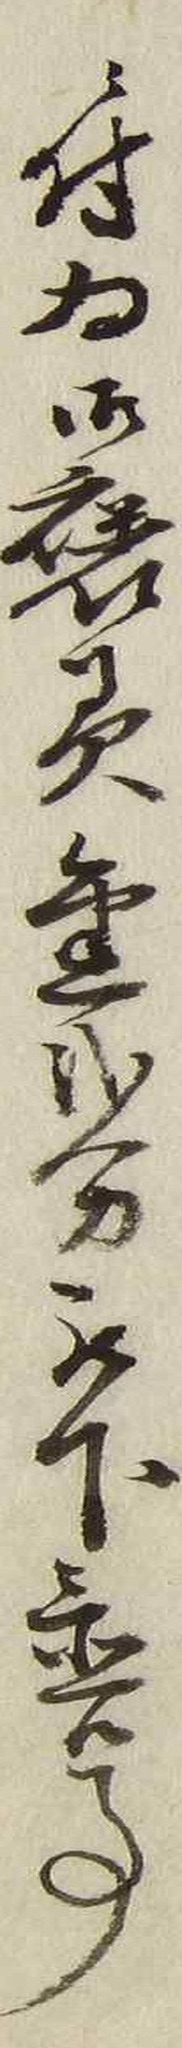ニ付為御褒美金弐分被下置候事

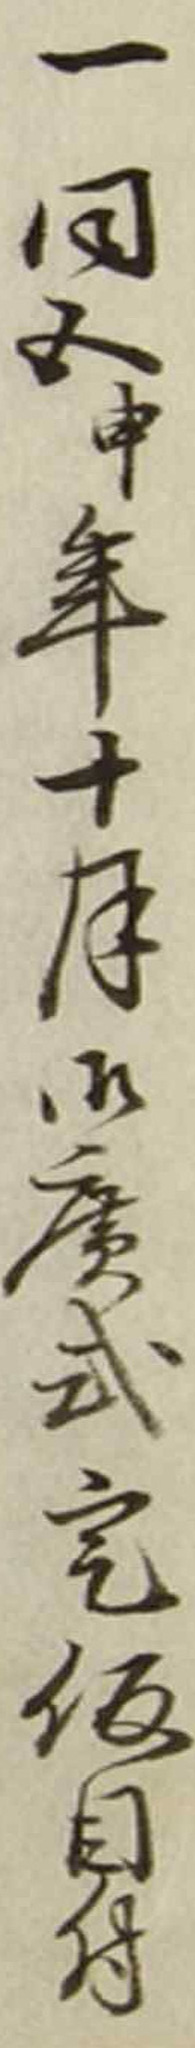一同五申年十月御広式定仮目付
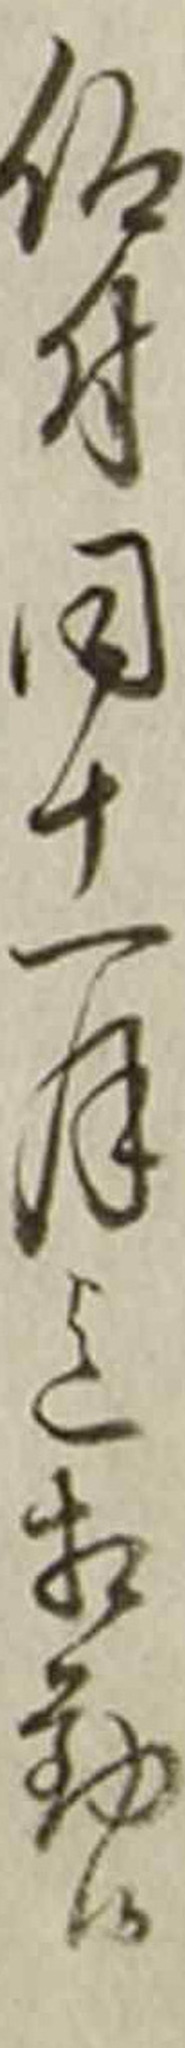被仰付同十一月迄相勤候
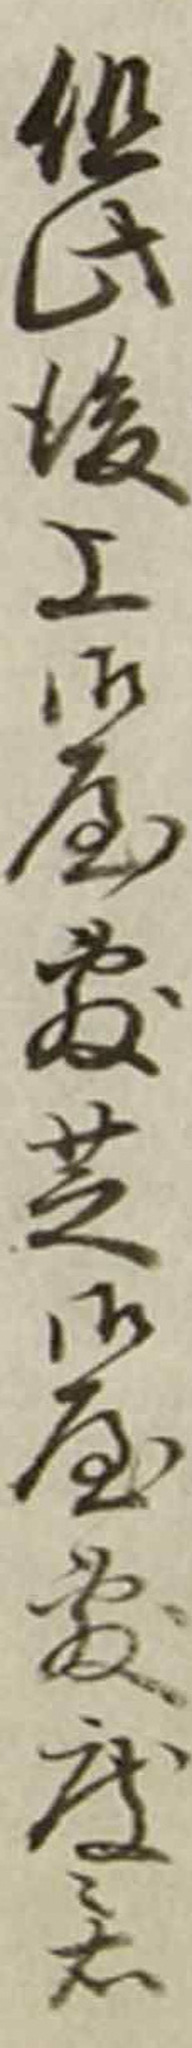但此後上御屋敷芝御屋敷度々右
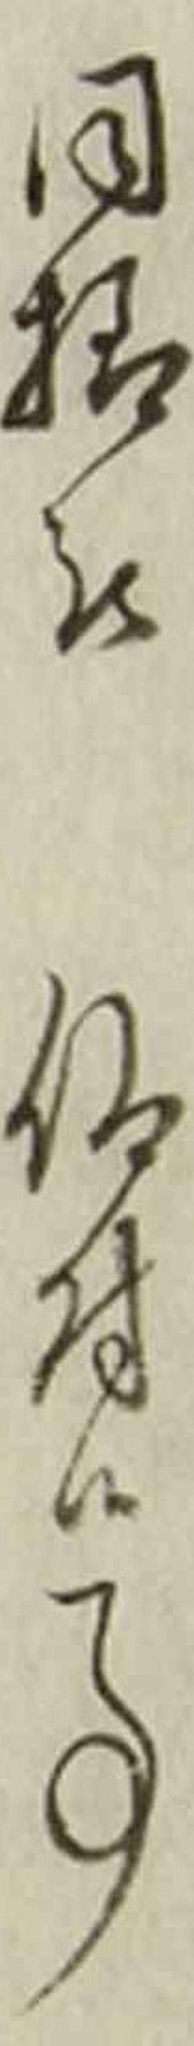同様被仰付候事
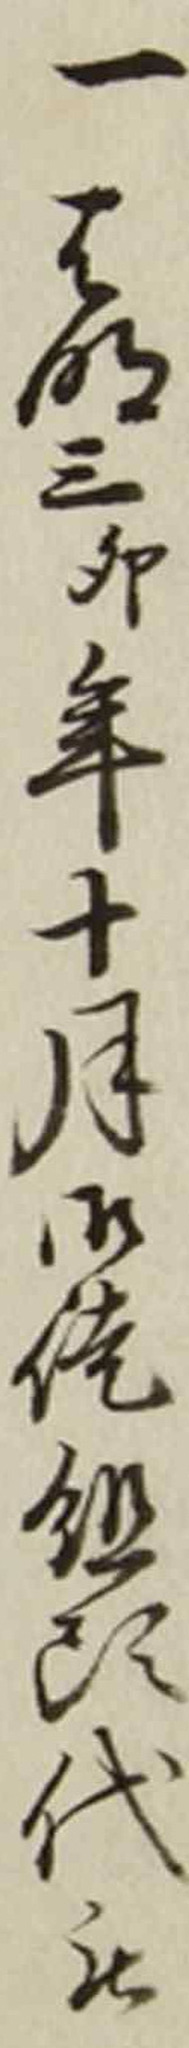一天明三卯年十月御徒組頭代被
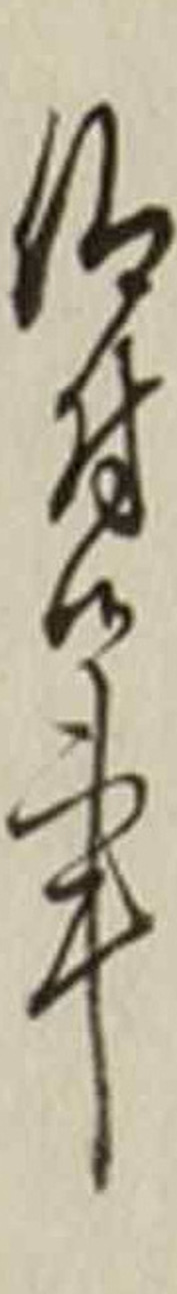仰付候事
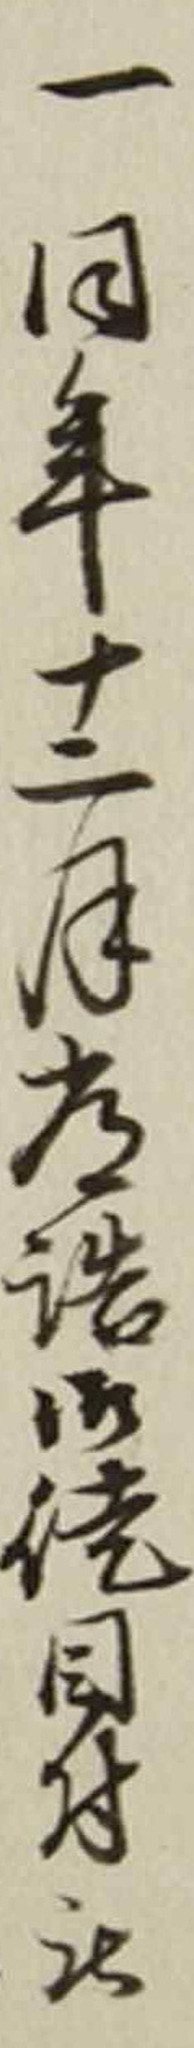一同年十二月常詰御徒目付被
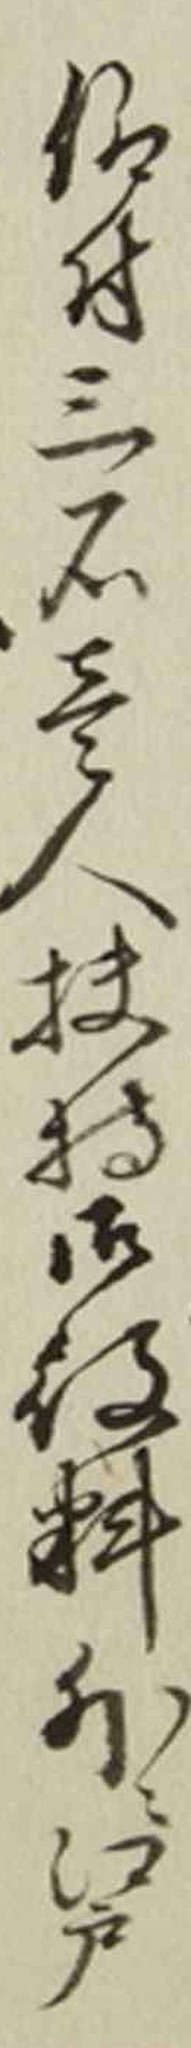仰付三石壱人扶持御役料外ニ江戸
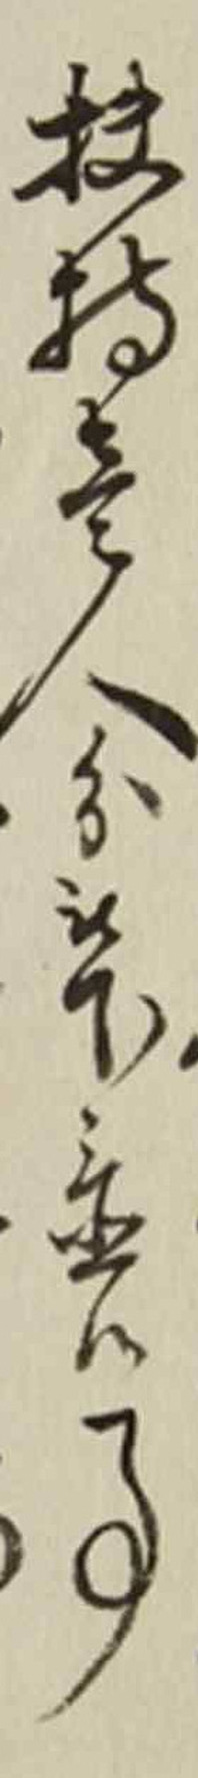扶持壱人分被下置候事
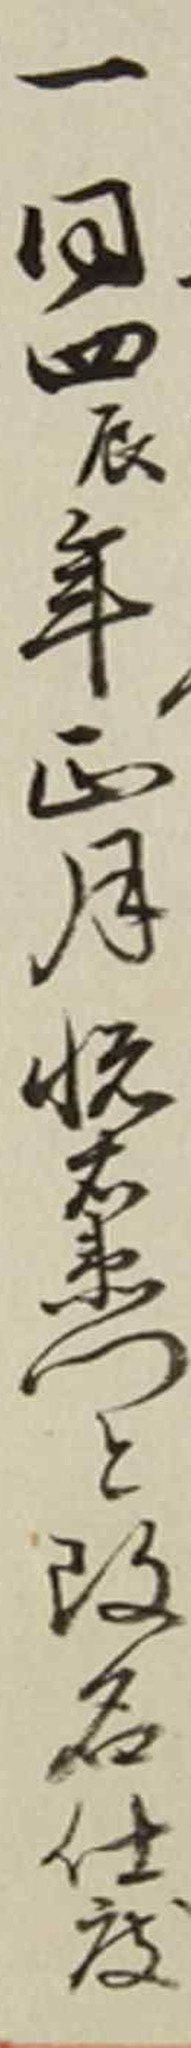一同四辰年正月悦右衛門と改名仕度
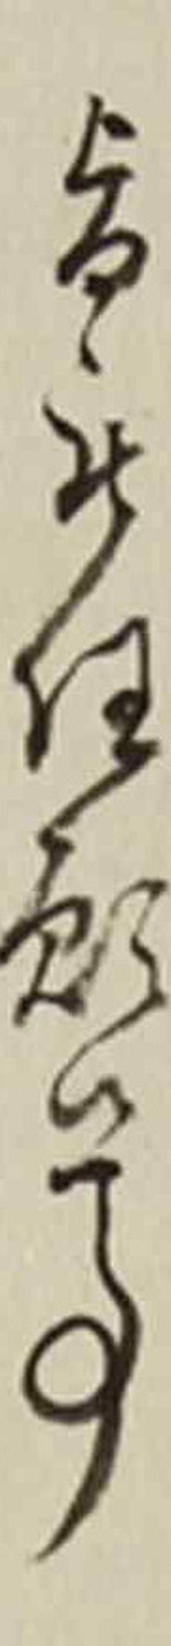旨被任願候事
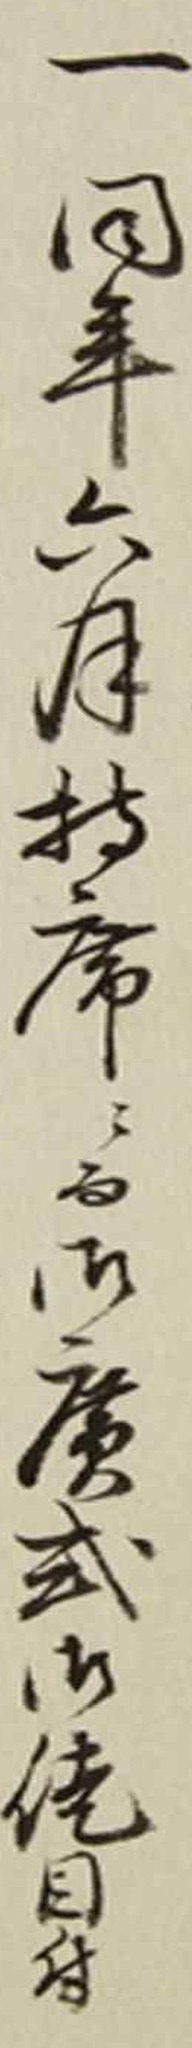一同年六月持席ニ而御広式御徒目付
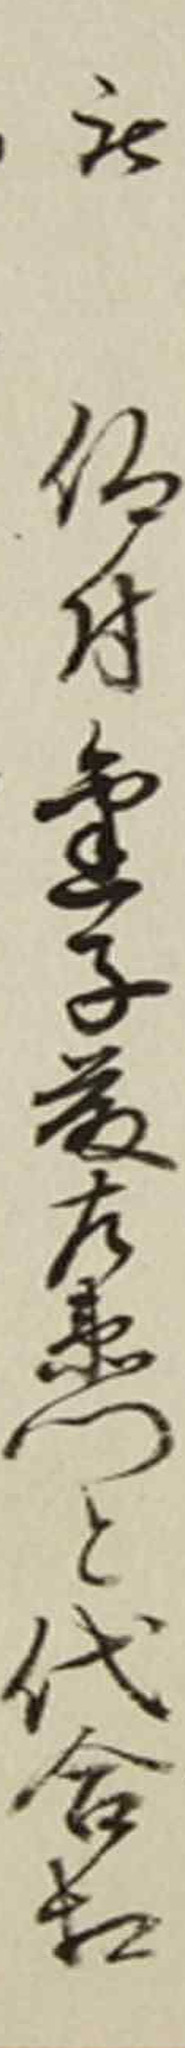被仰付金子藤左衛門と代合相
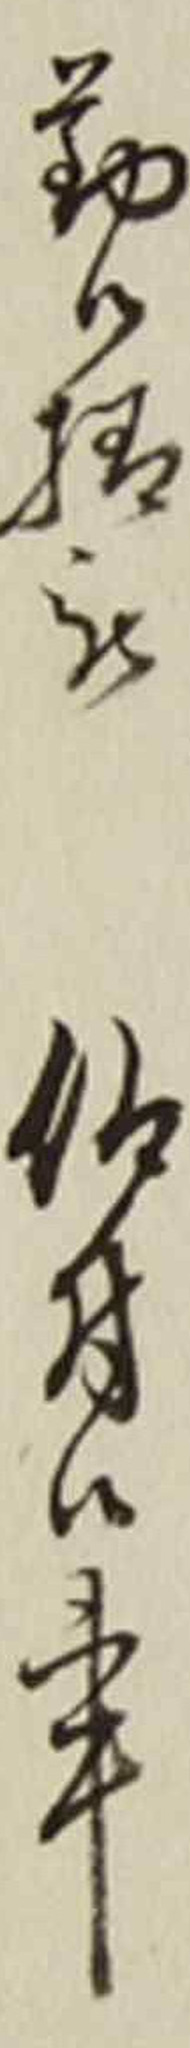勤候様被仰付候事
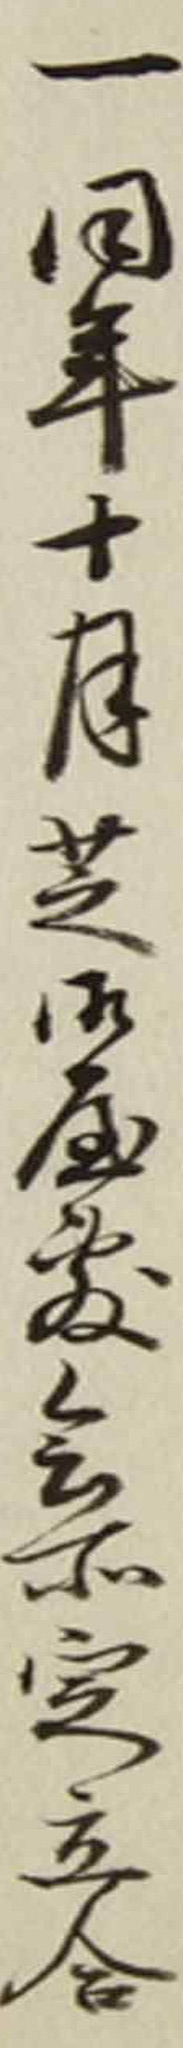一同年十月芝御屋敷会所定立合
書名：諸士系譜　巻之39　は之部7
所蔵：会津若松市立会津図書館
